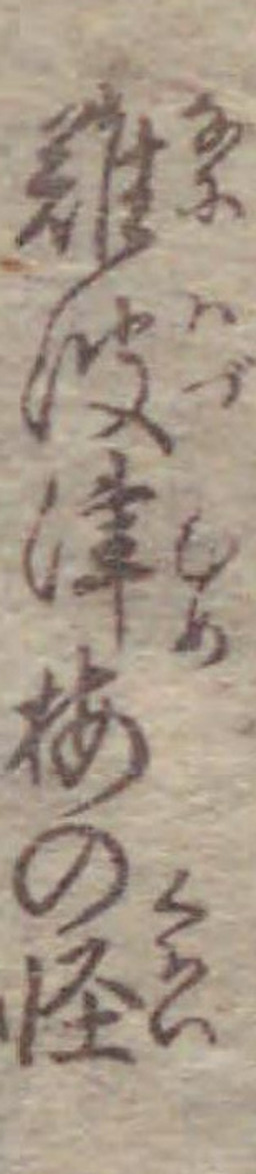難波津梅の怪
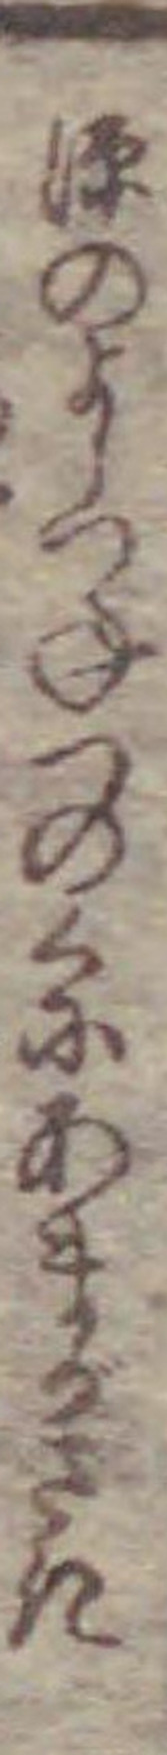源のよしつねつのくにあまがさき
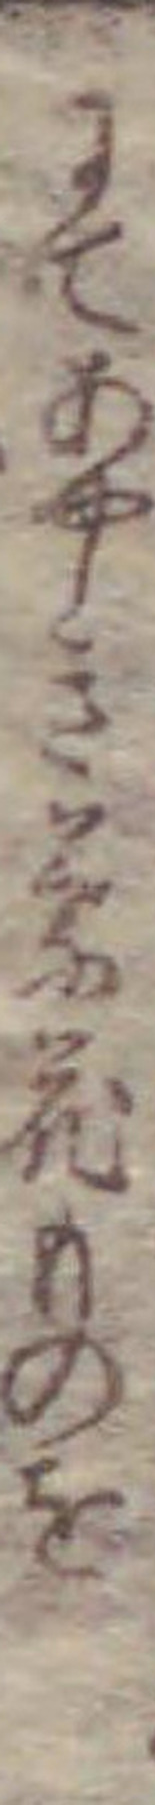にてあやしき葉花ものを
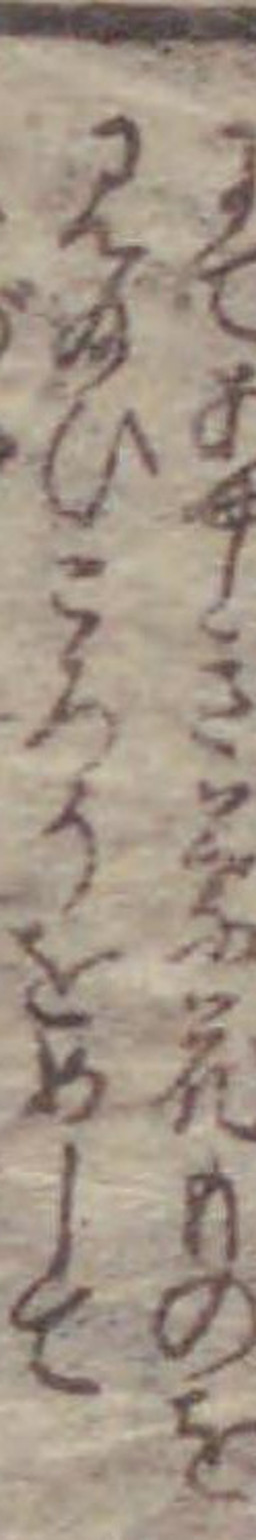見給ひころうをめして
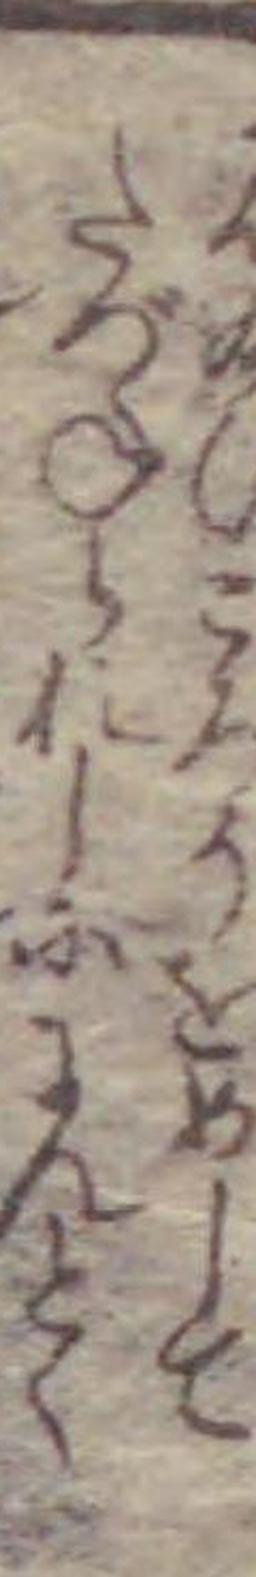たづねられしににんとく
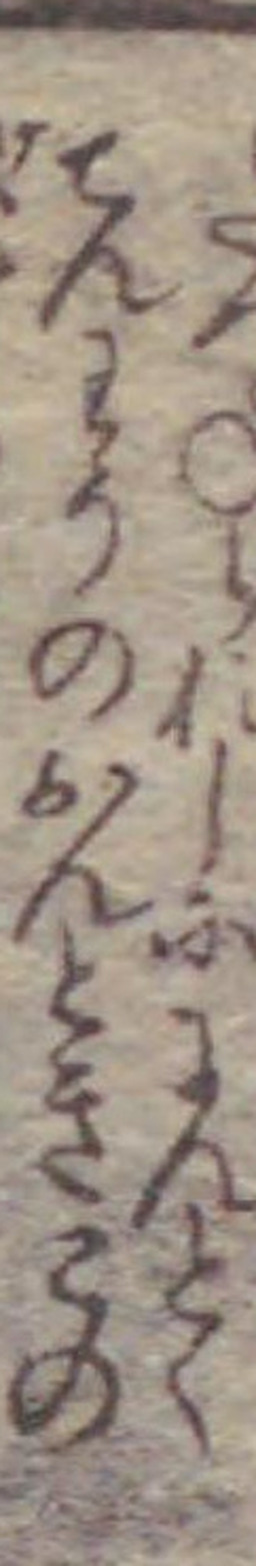てんわうのおんときこの
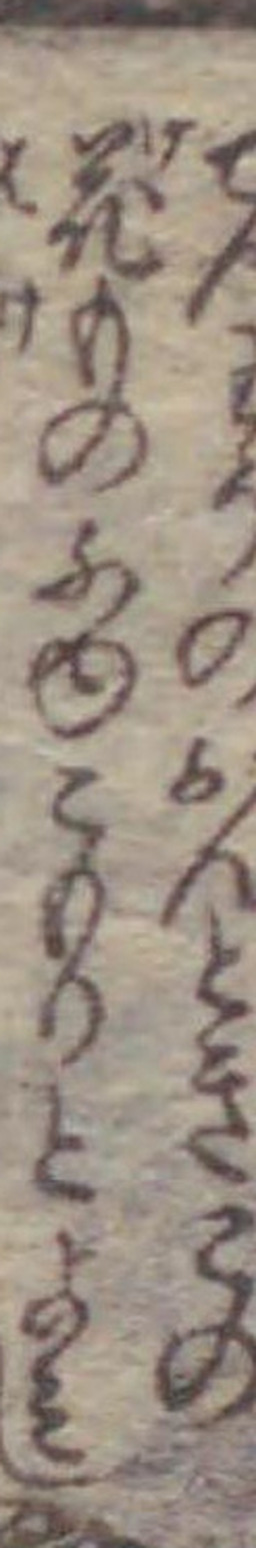花ものふゆこもりとよみし
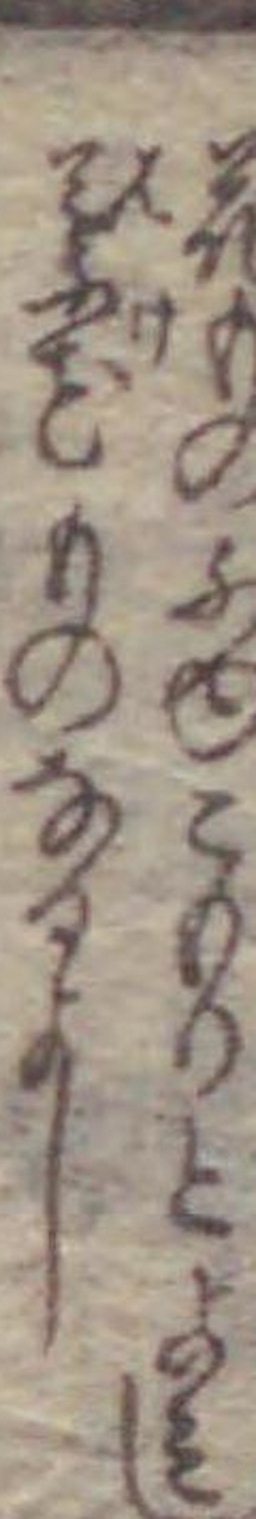葉花ものなるよし
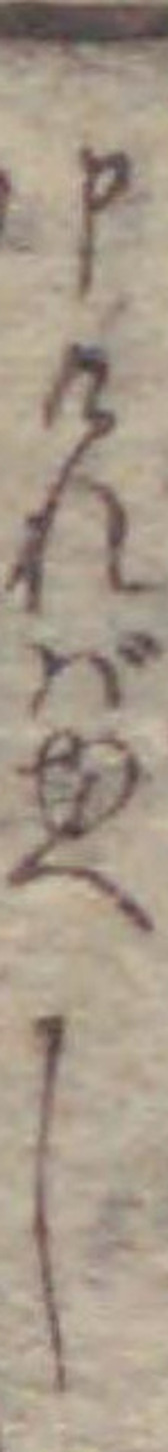申ければゆへ
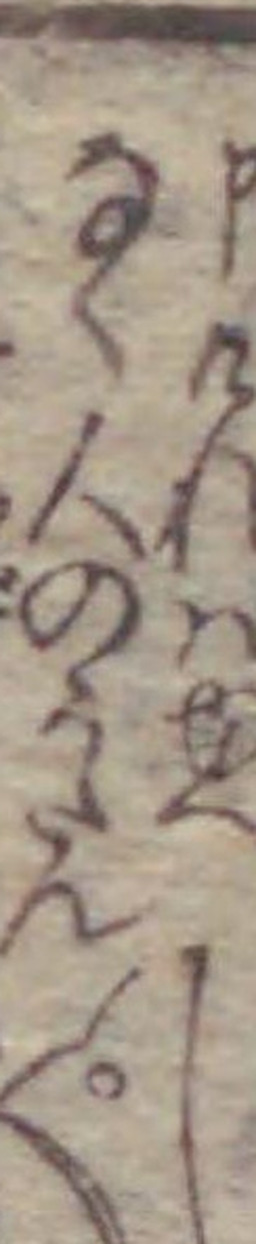なく人のうたん
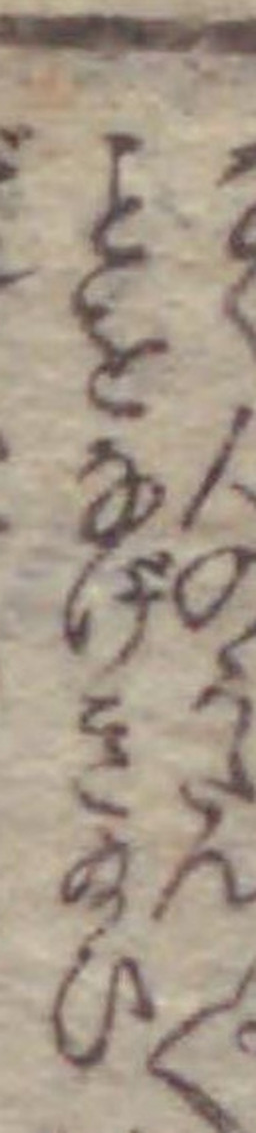ことをなげき給ひ
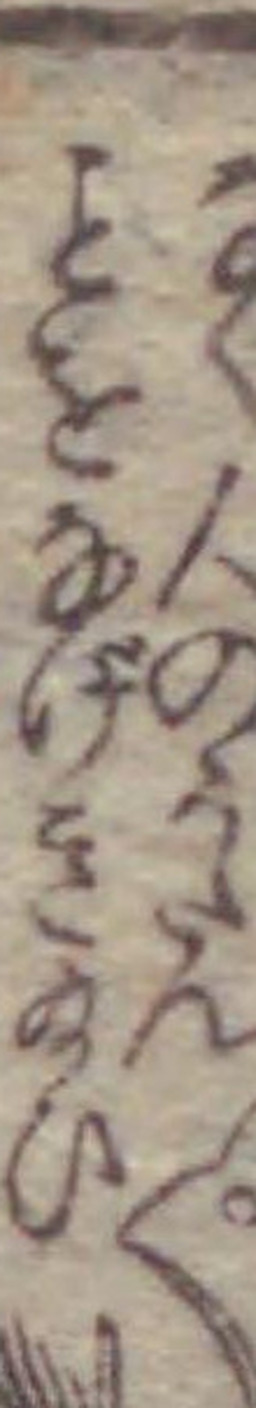ことをなげき給ひ
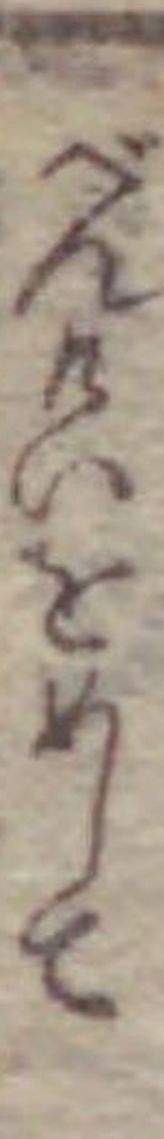べんけいをめして
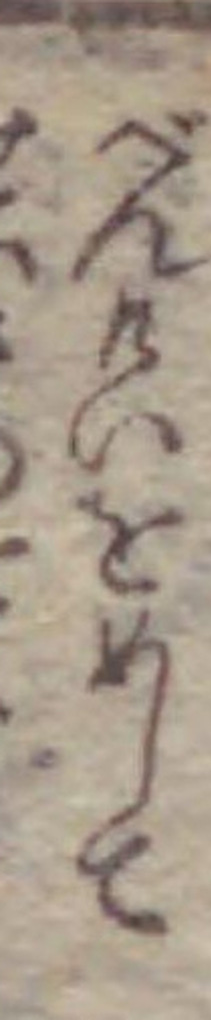べんけいをめして
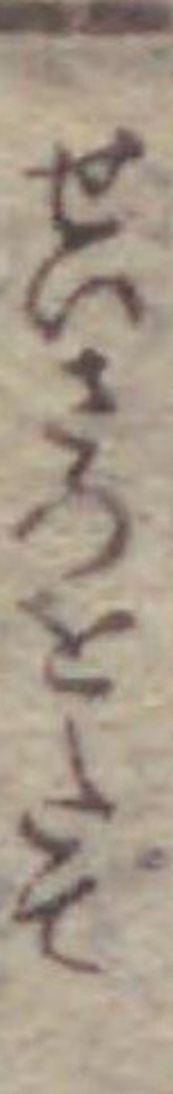せいさつをたて
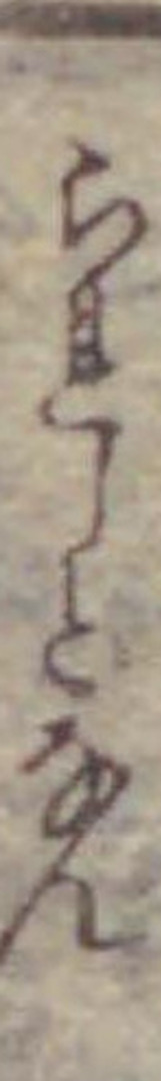られしとなん
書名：武家物奇談 : 3巻
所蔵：国立国会図書館 National Diet Library, JAPAN
